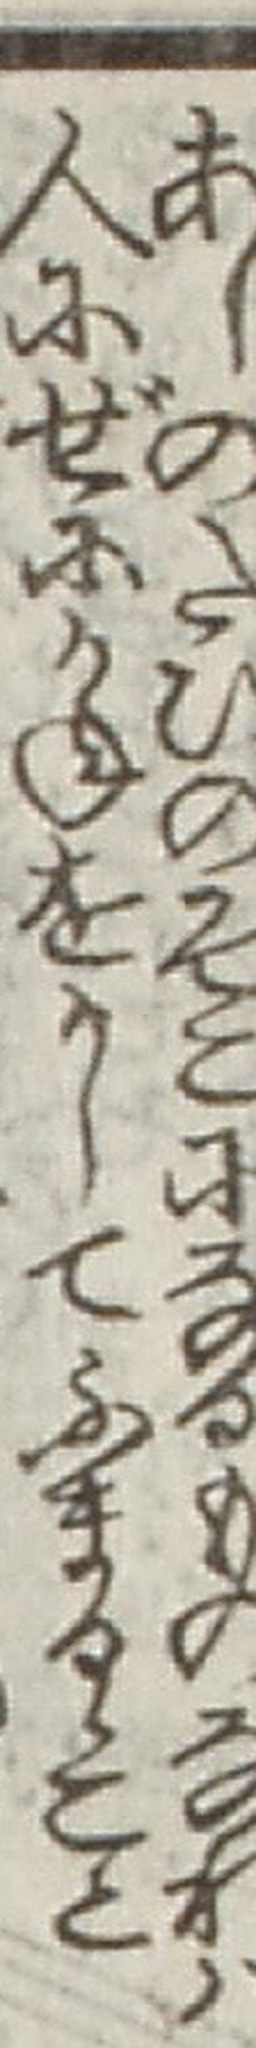人にぜにかねをかしてふまるゝこと
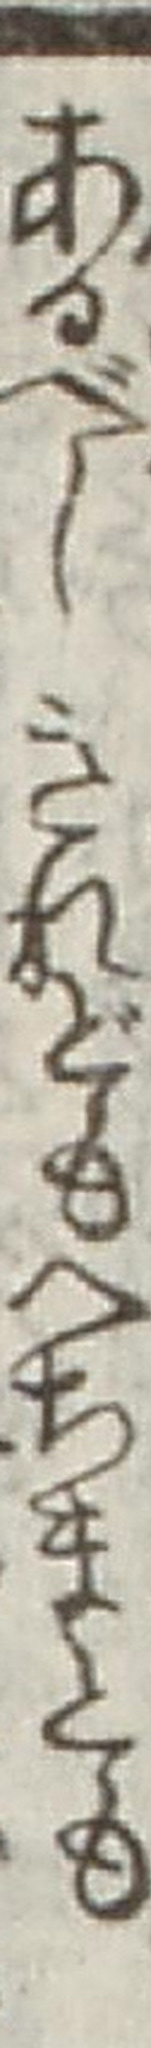あるべしされどもへちまとも
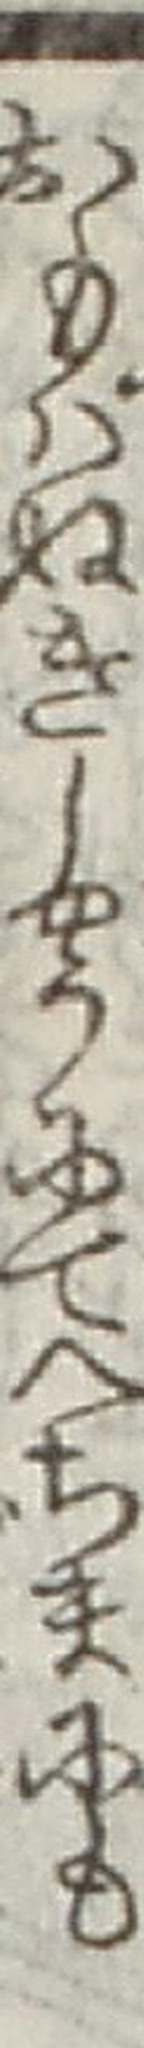おもはぬきしやうにてへちまにも
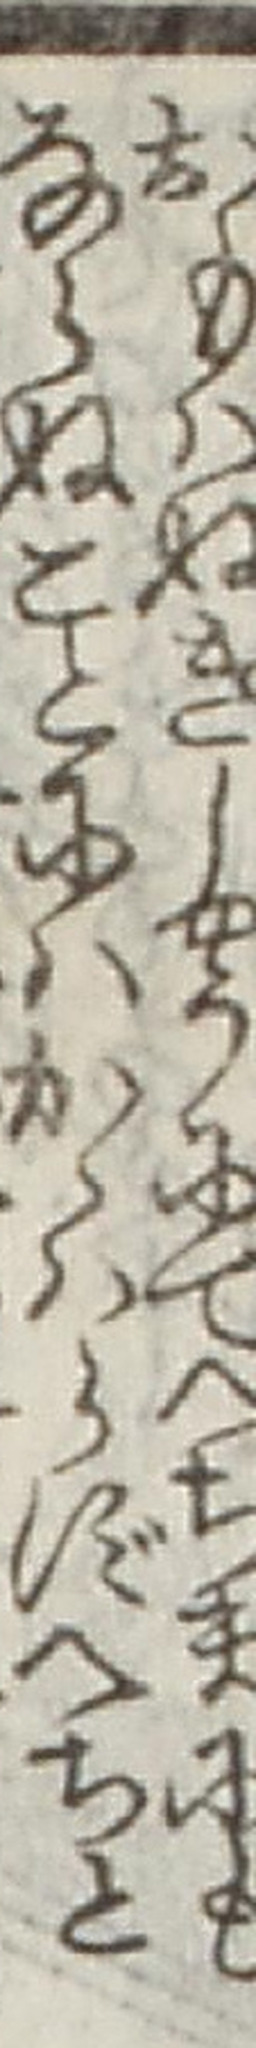ならぬことにはかゝはらずへちと
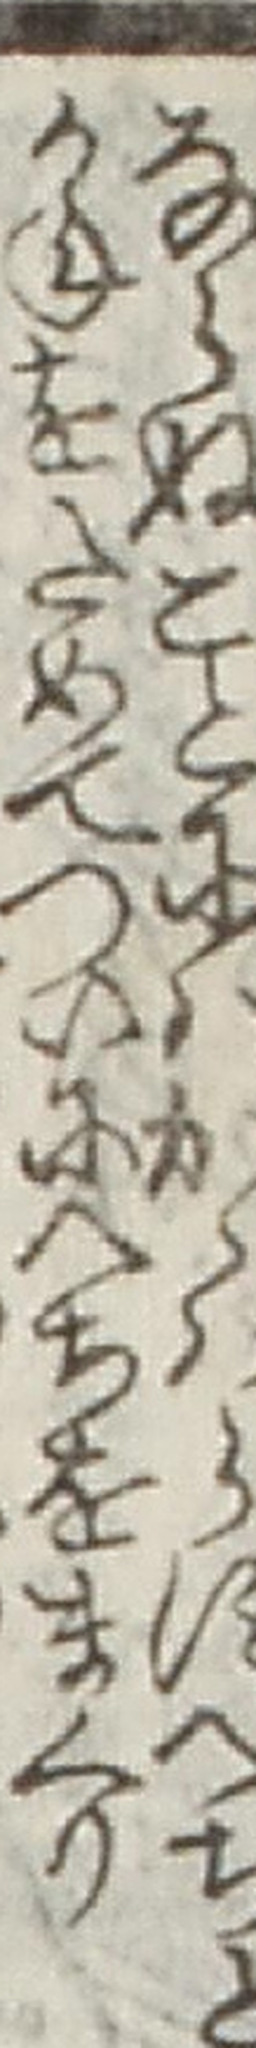かねをためてついにへちをまくり
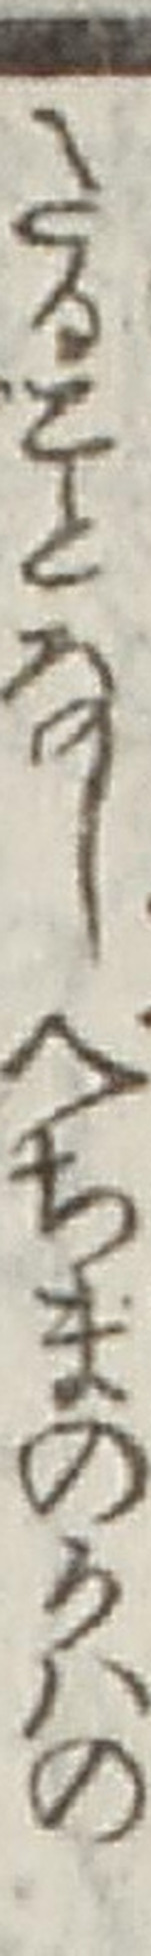たることなしへちまのかはの
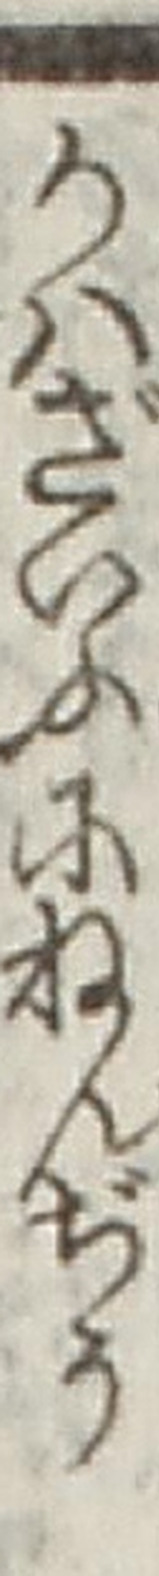かはざいふにねんぢう
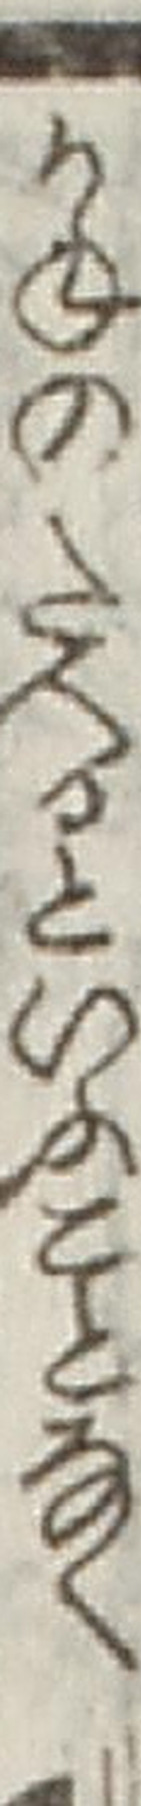かねのたへるといふことなく
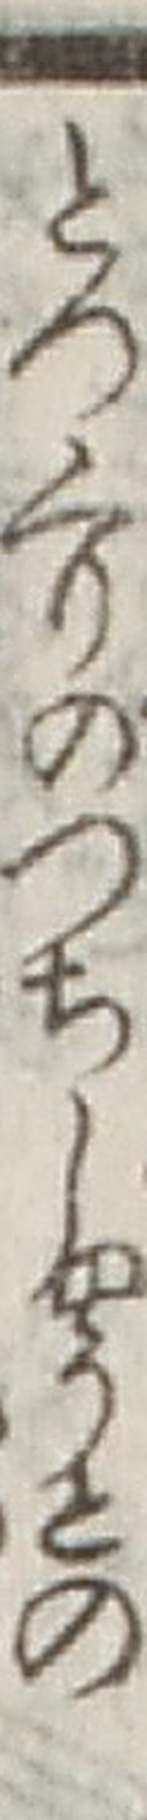とつくりのつちしやうとの
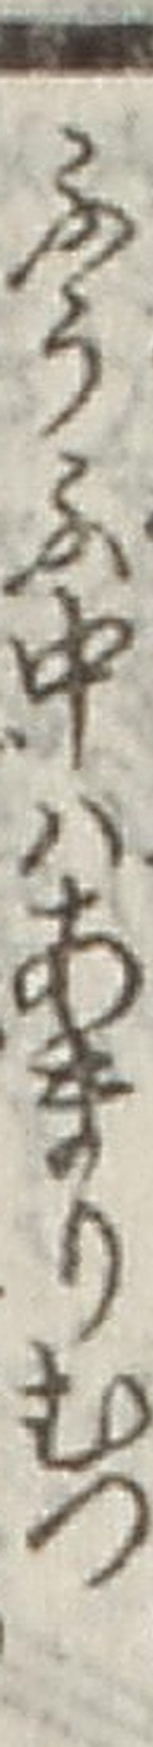ふうふ中はあまりむつ
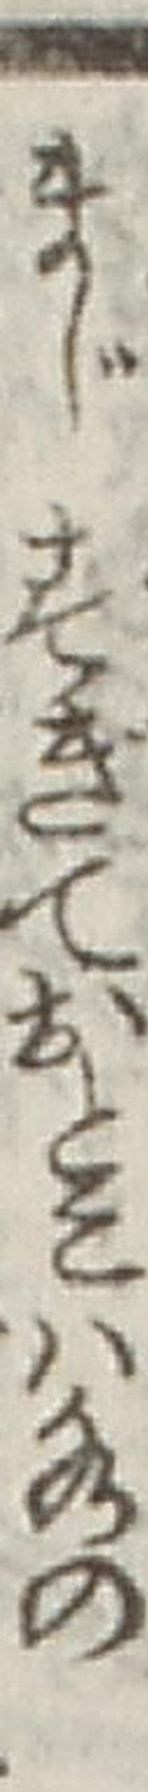まじすぎておとこは水の
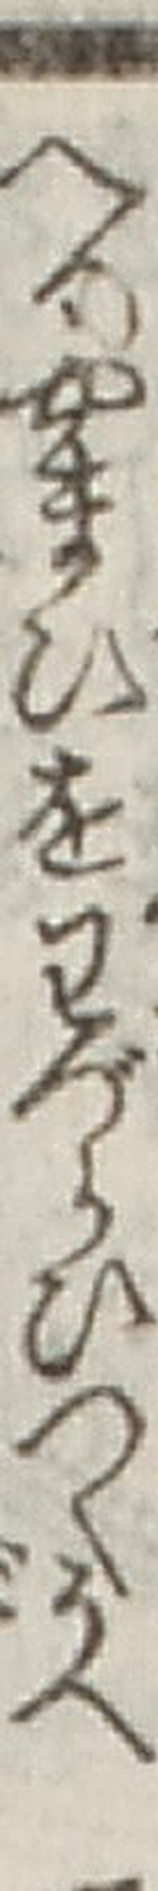へやまひをわづらひつくうへ
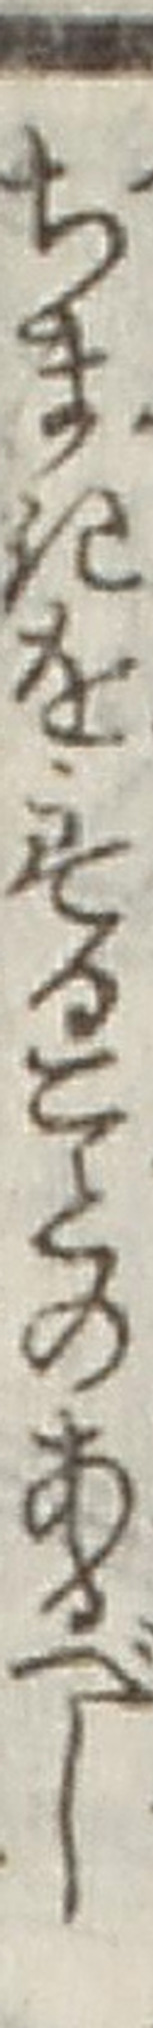ちまきをすることのあるべし
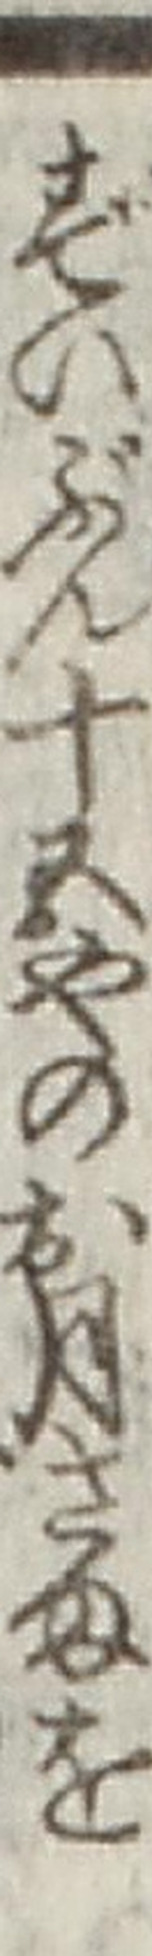ずいぶん十五やのお月さまを
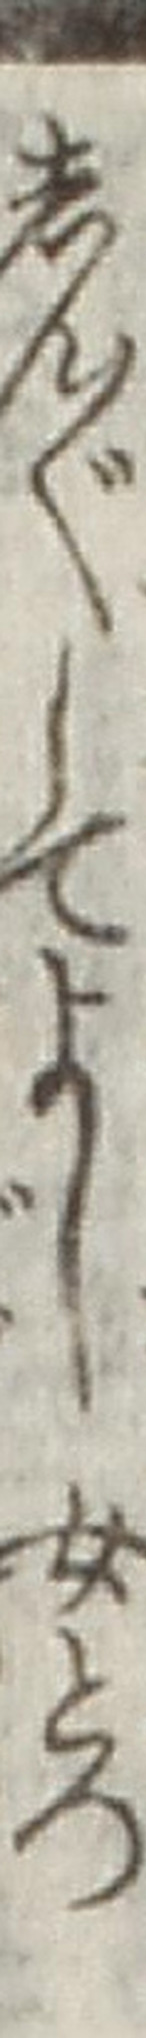しん〴〵してよし女とつ
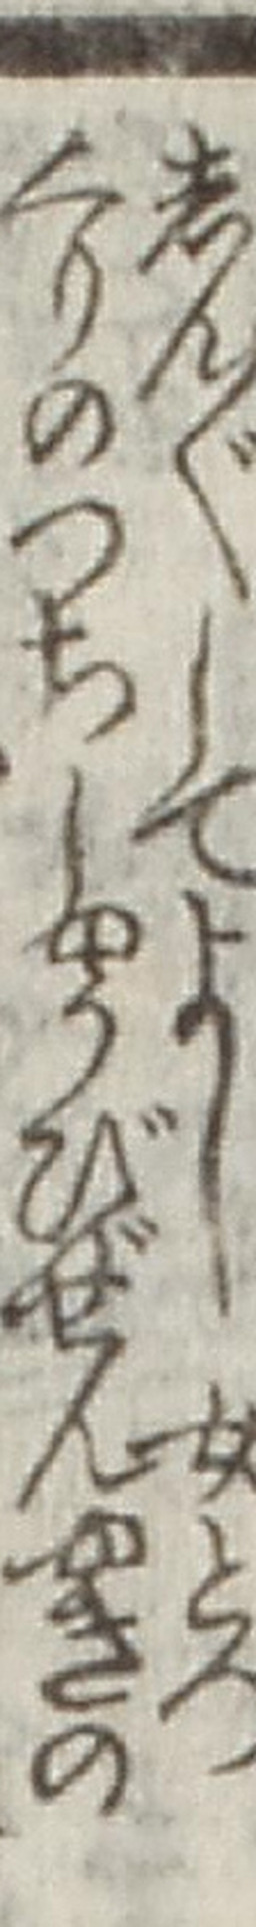くりのつちしやうびぜんやきの
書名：三世相出雲當座帳　上下冊
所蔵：東京大学地震研究所図書室 Earthquake Research Institute Library, The University of Tokyo, JAPAN
